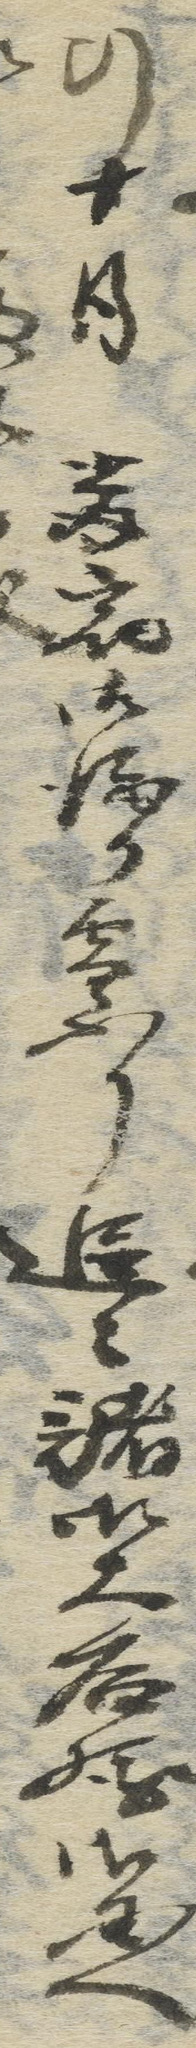行十月当宿御泊り雪ふり追々諸御大名様御国へ
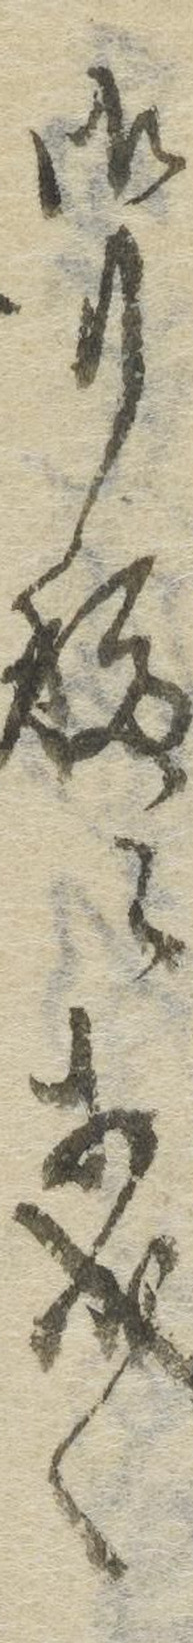御引移二相成候
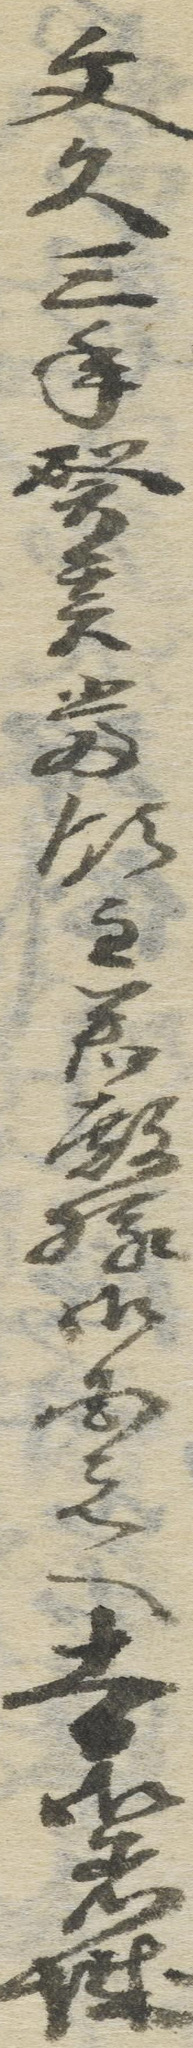文久三年癸亥当領主若殿様御国元へ十一日御着城
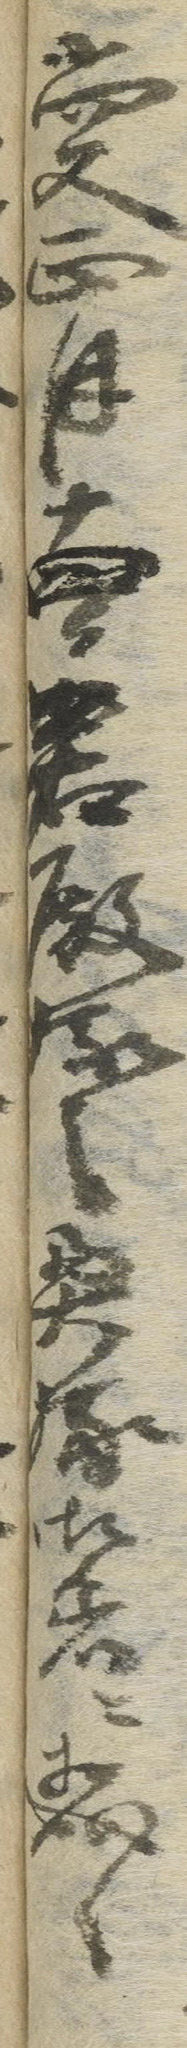尚又正月十四日若殿様之奥様御着二相成候
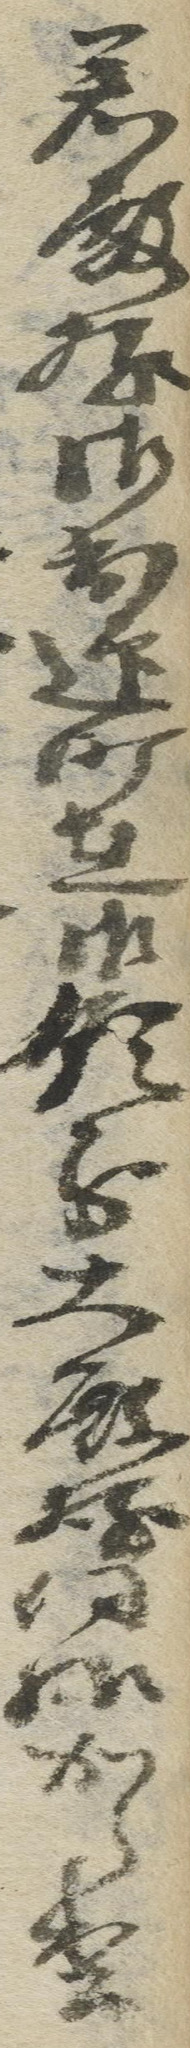若殿様御出迎町在御領分大殿様同様かり堂
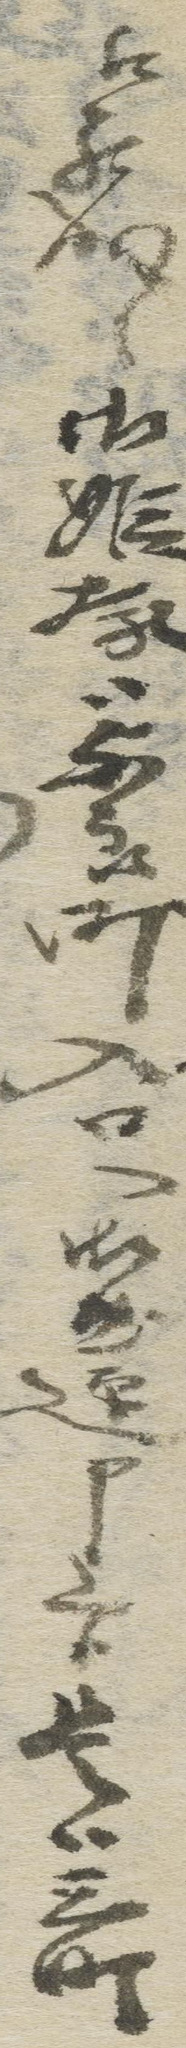江罷成御姫様ハ与良町入口へ御出迎申上候是ハ三町
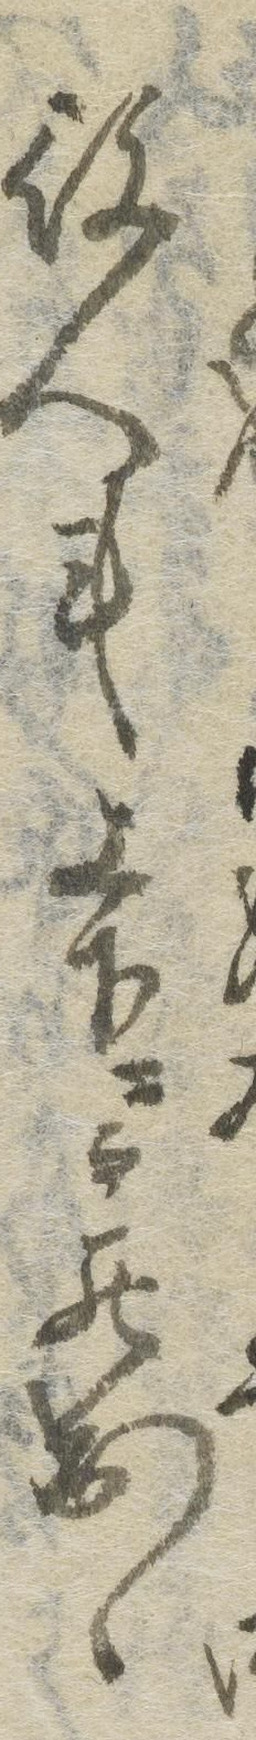役人計上下二而罷出候
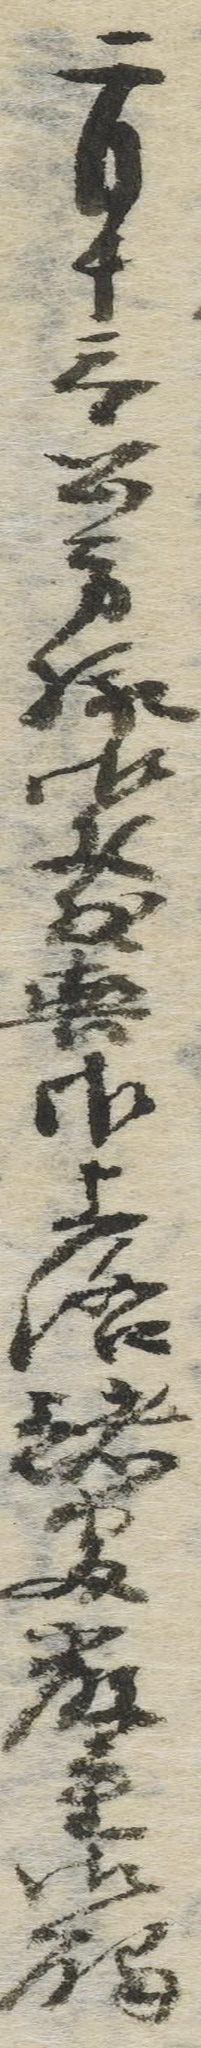二月十三日公方様御発輿御上洛諸番厳重御触
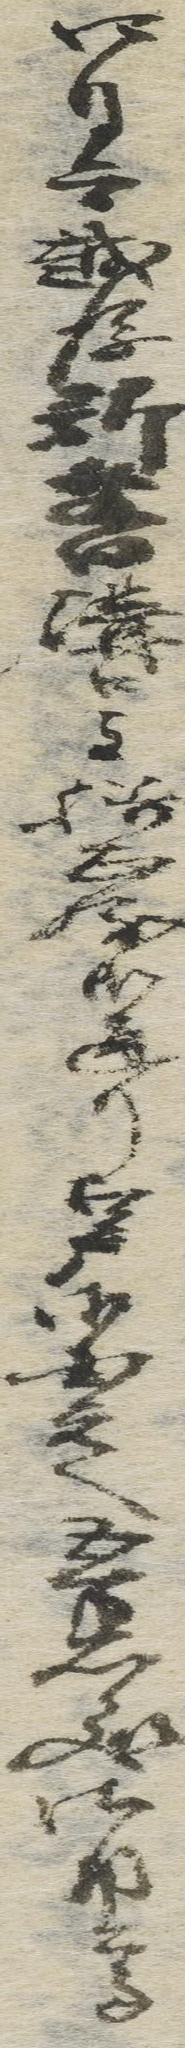四月二日越後新発田溝口主膳正様御通行江戸御国元へ五万石之処御用高
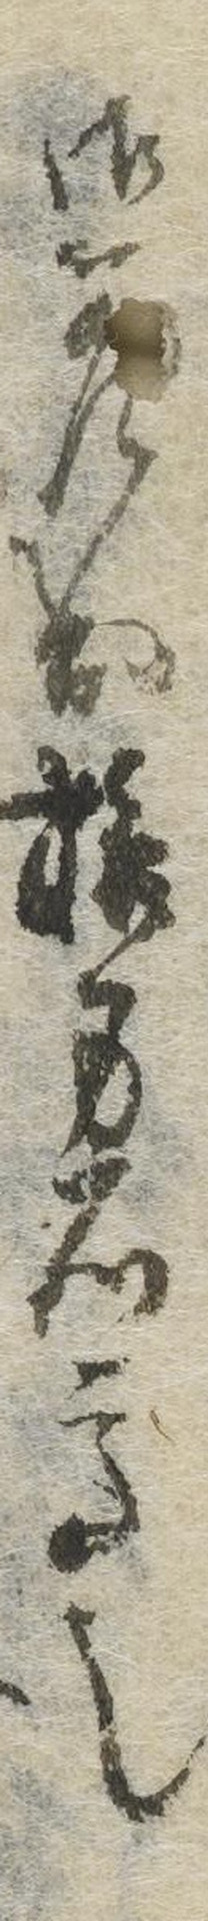御差出拾万石高也
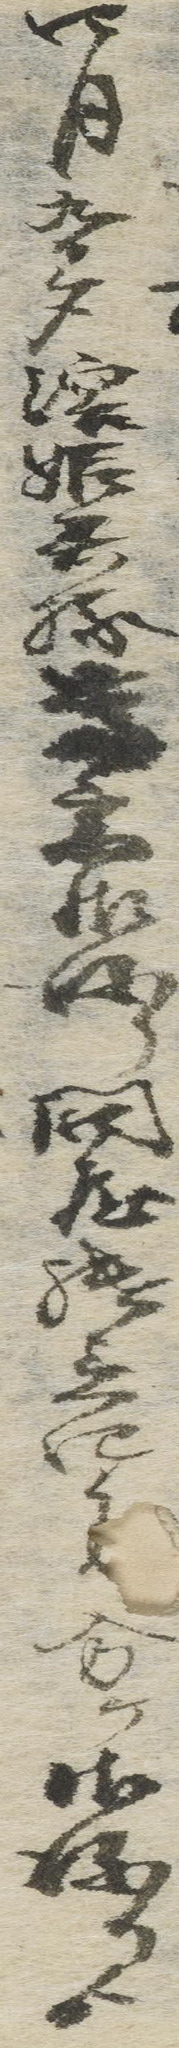四月九日夕溶姫君様当宿御泊り問屋継立四手に分ヶ御泊りゟ
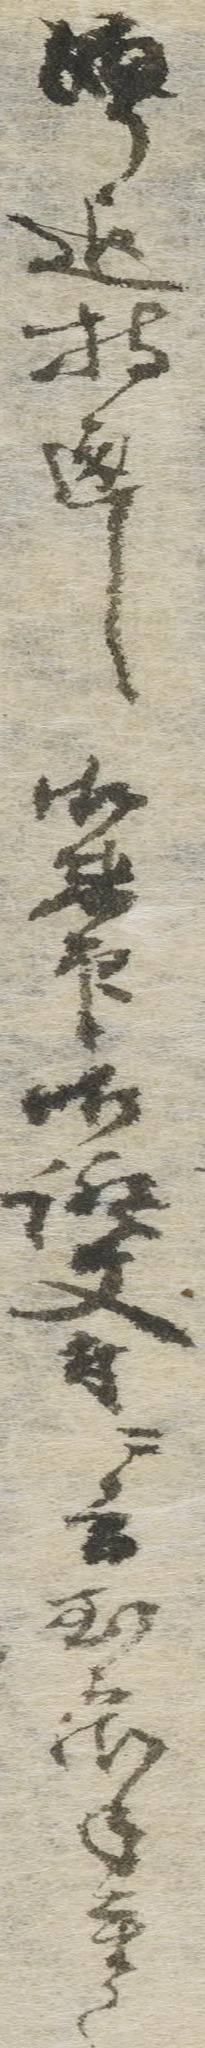泊り迄持通し御朱印御証文付二而至而御手也
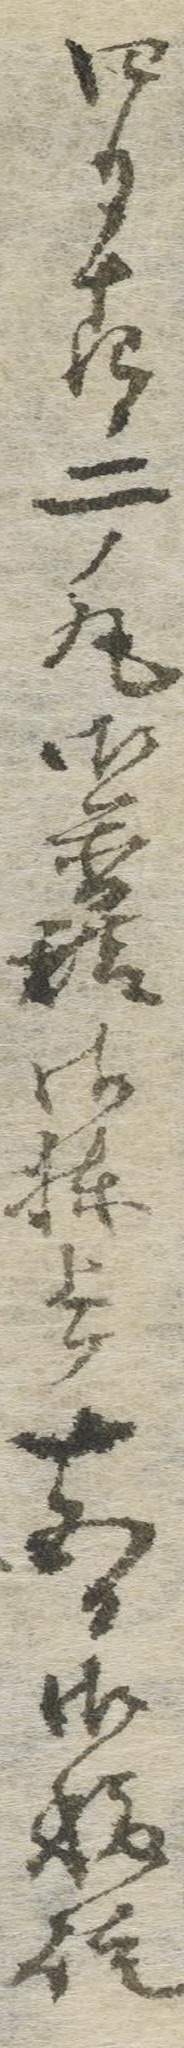四月十四日二ノ丸御普請御棟上ヶ十五日御移住
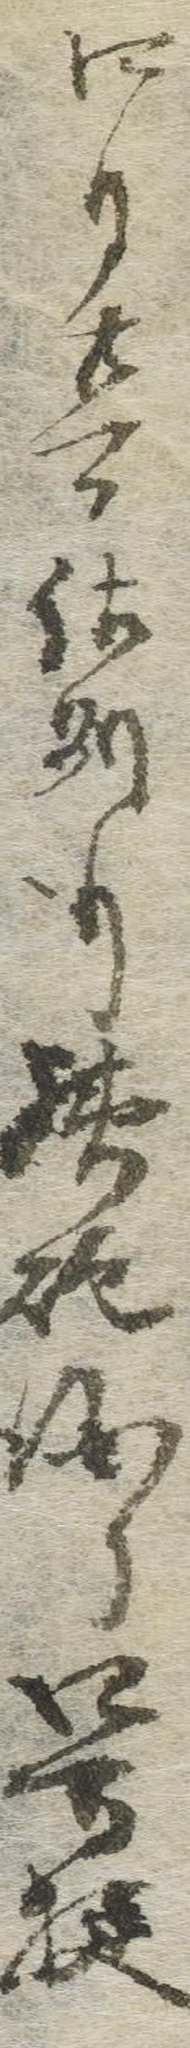四月廿一日佐州行鉄砲泊り四万挺
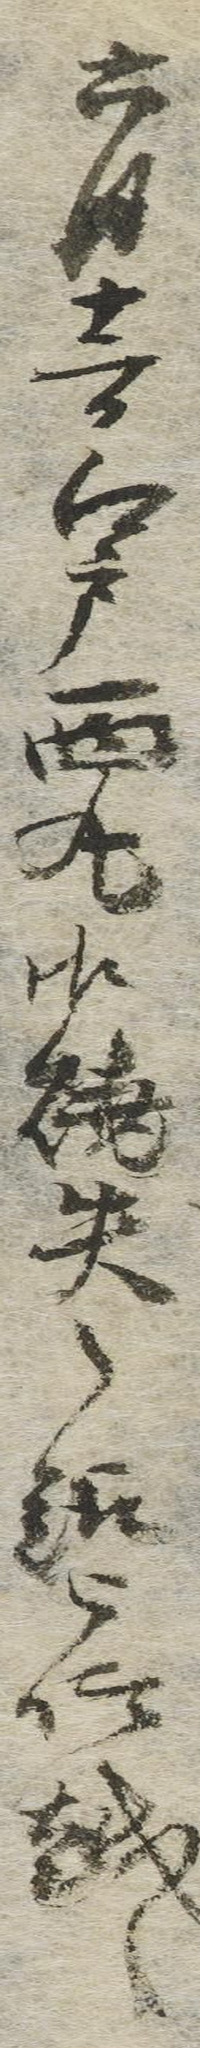六月十二日江戸西丸御焼失之趣被仰越候
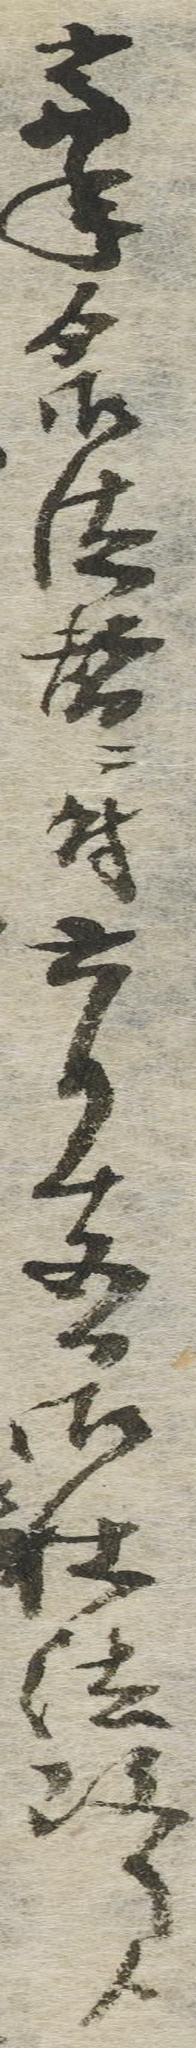当年ゟ御仕替二付六月十五日御仕法改り候
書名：信濃越後　地震書留
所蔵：東京大学地震研究所図書室 Earthquake Research Institute Library, The University of Tokyo, JAPAN
